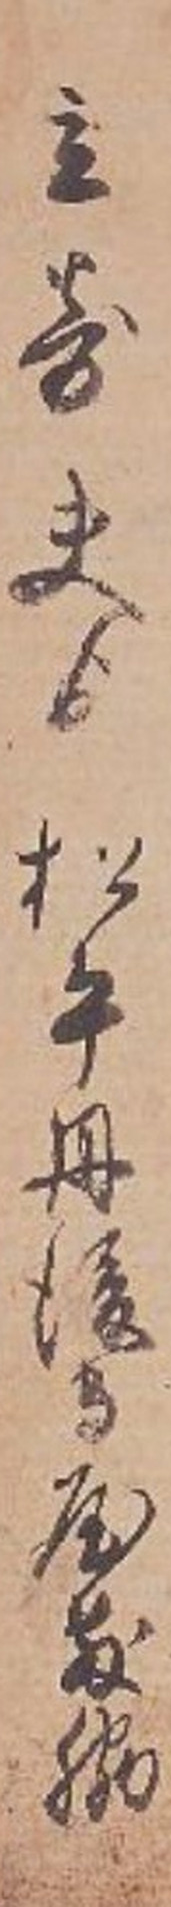立寄夫ゟ松平丹後守屋敷脇

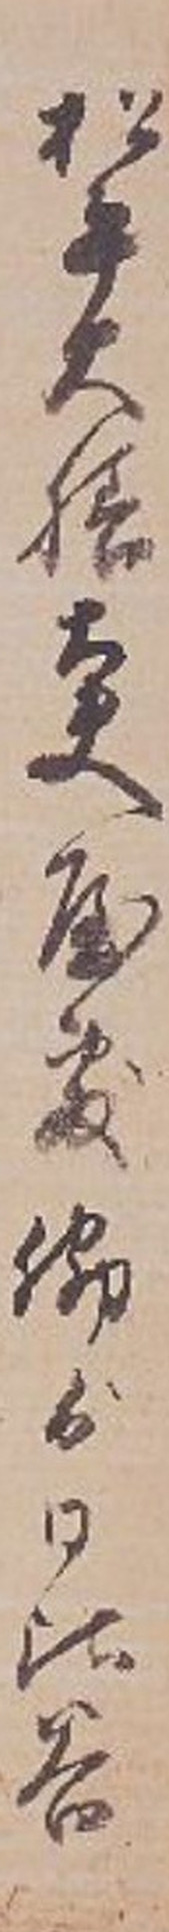松平大膳大夫屋敷脇ゟ日比谷
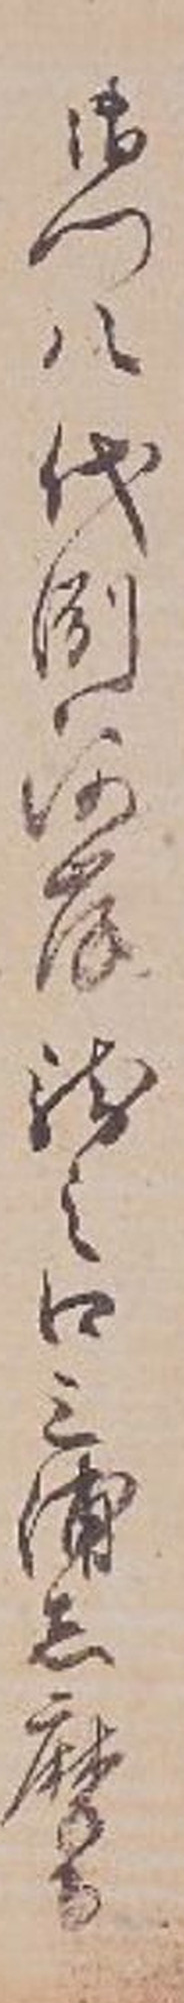御門八代洲河岸之口三浦志摩守
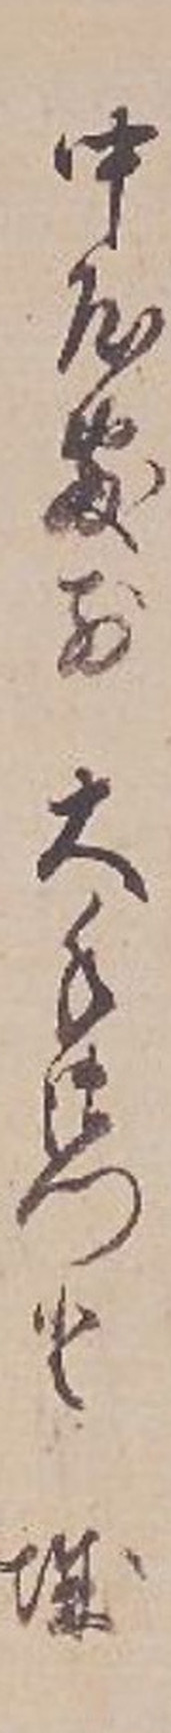中屋敷前大手御門登城
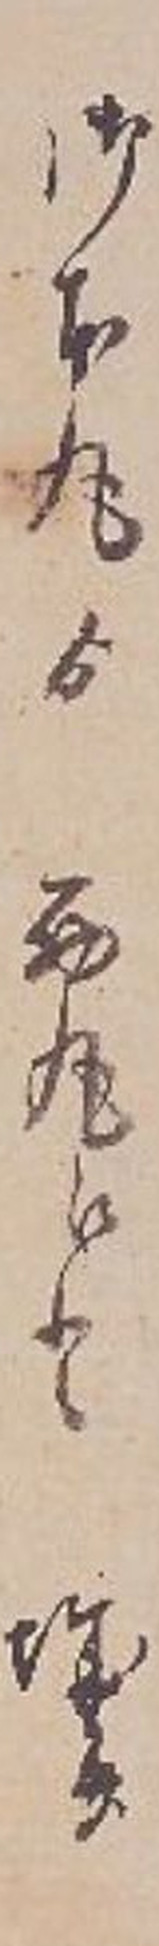御本丸ゟ西丸え登城幷
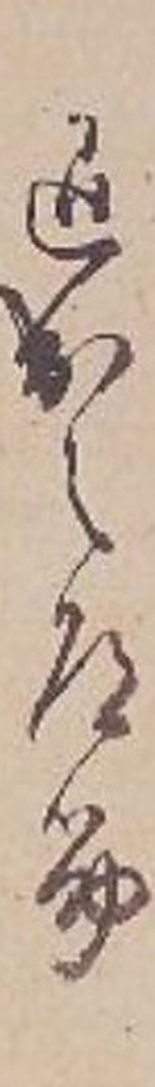退出之道筋
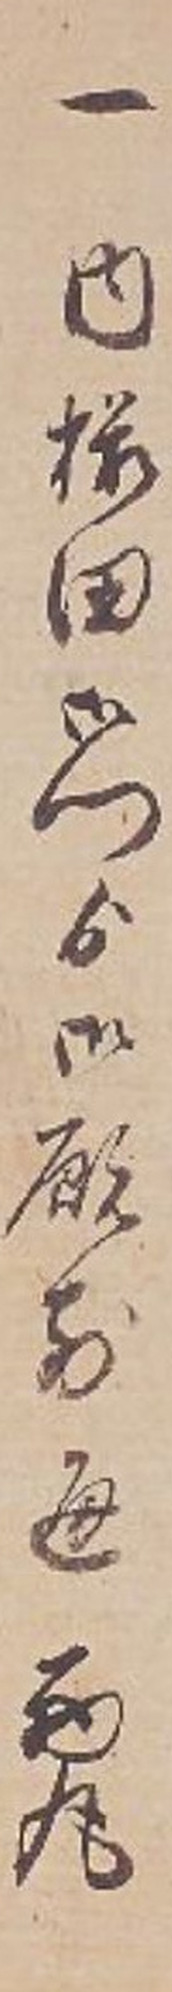一内桜田御門ゟ御殿前通西丸
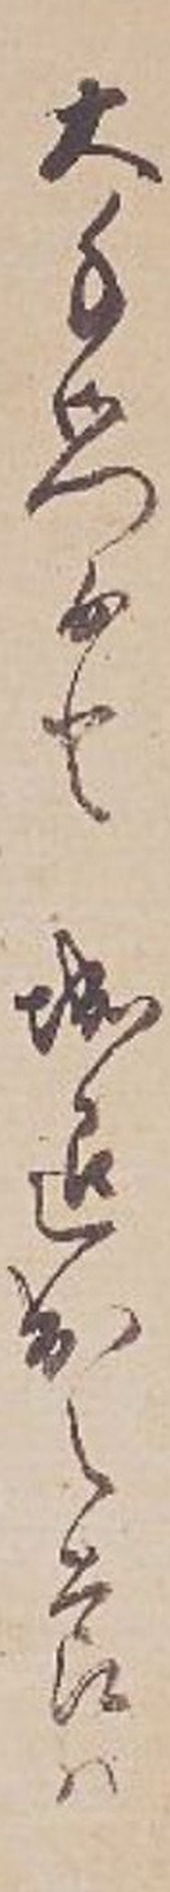大手御門ゟ登城退出之節ハ
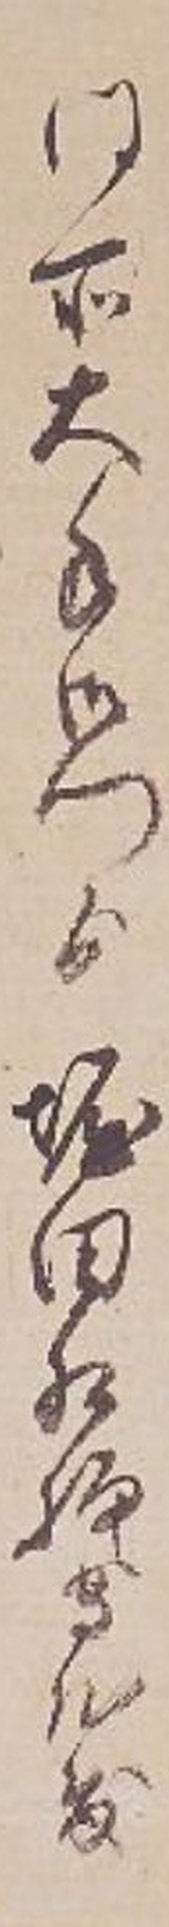同所大手御門ゟ堀田相模守屋敷
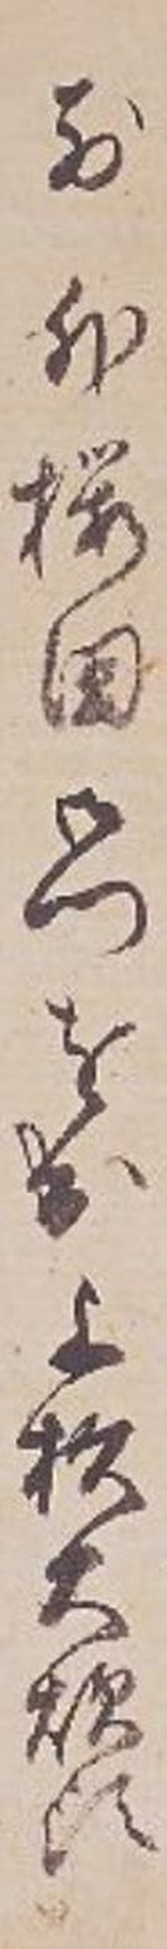前外桜田御門を出上杉大炊頭
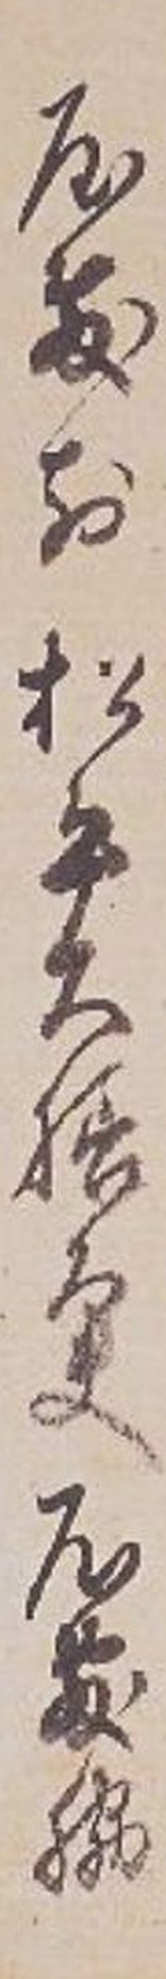屋敷前松平大膳大夫屋敷脇
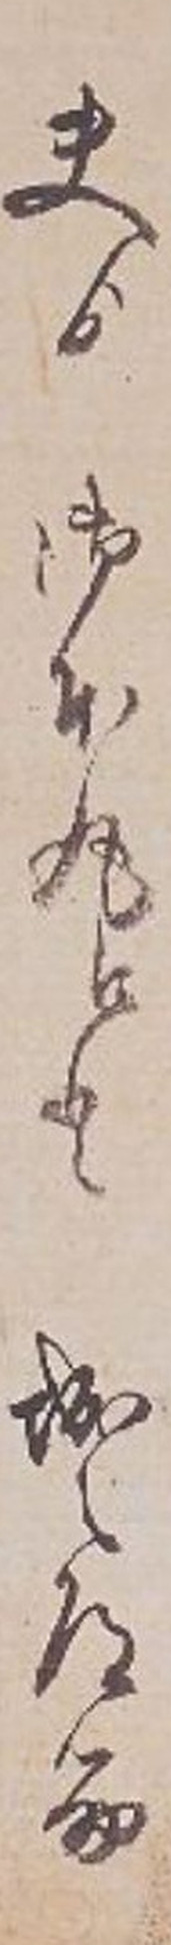夫ゟ御本丸え登城の道筋
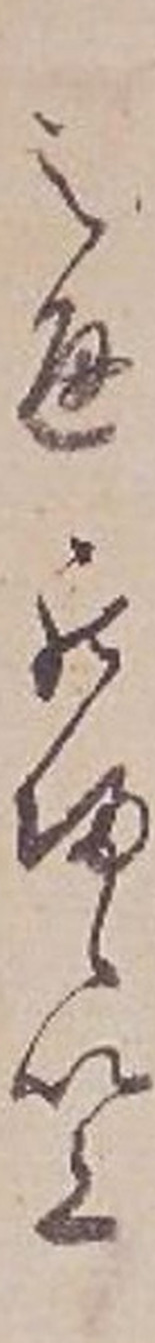之通被帰候以上

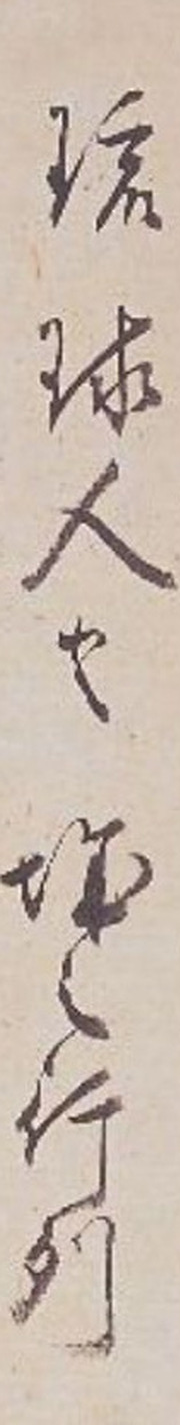琉球人登城之行列

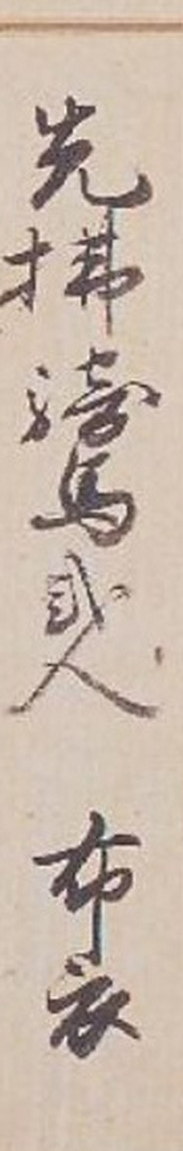先払騎馬武人布衣

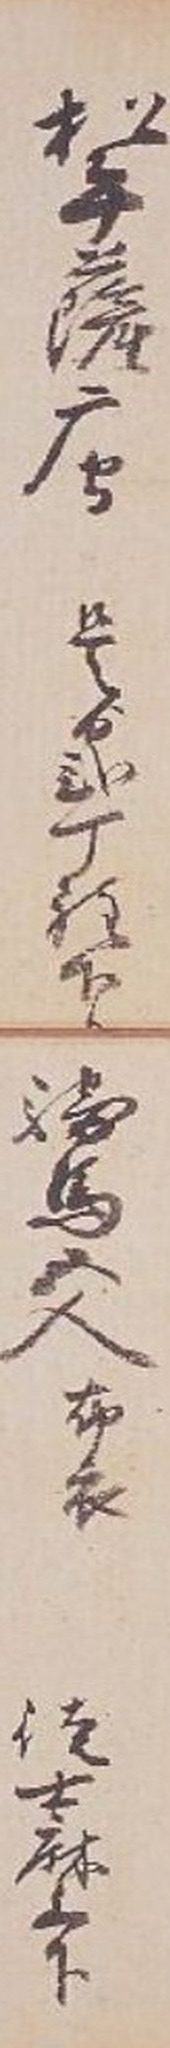松平薩摩守是ゟ弐丁程下騎馬五人布衣徒士尉上下
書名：琉球人来朝記 三、四
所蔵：University of the Ryukyus Library
